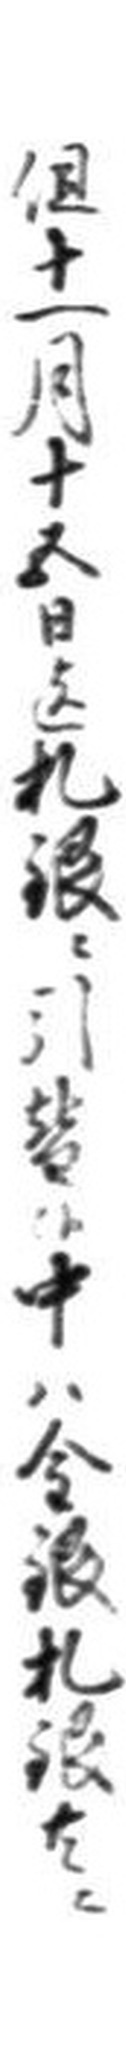但十一月十五日迄札銀ニ引替候中ハ金銀札銀共ニ
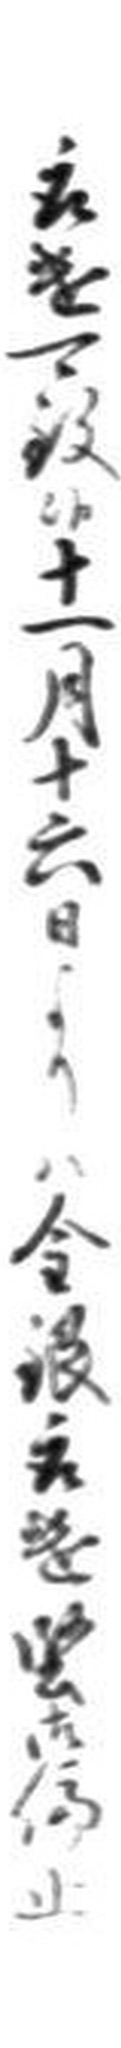取遣可致候十一月十六日よりハ金銀取遣堅御停止
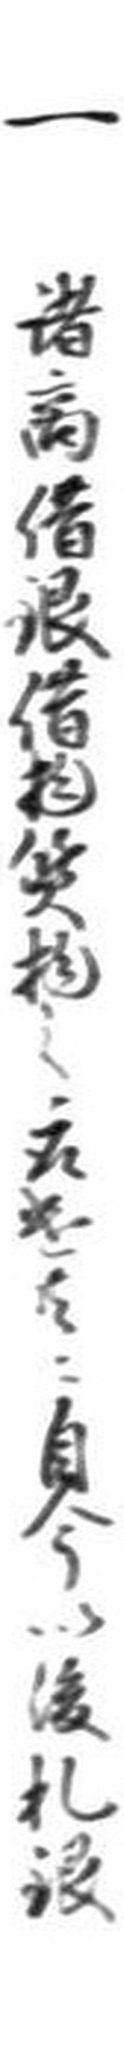一諸商借銀借物質物之取遣共ニ自今以後札銀
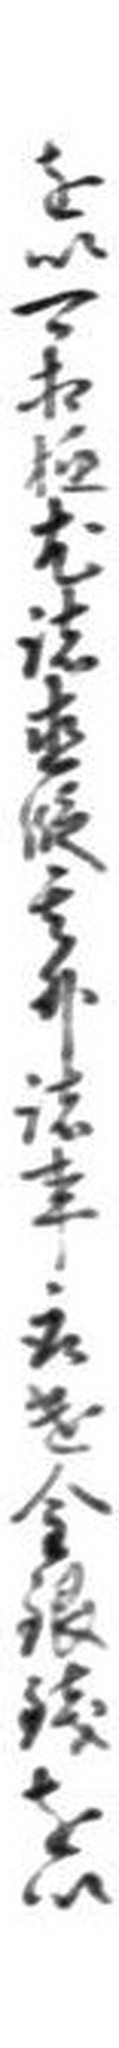を以可相極尤諸直段其外諸事取遣金銀銭を以
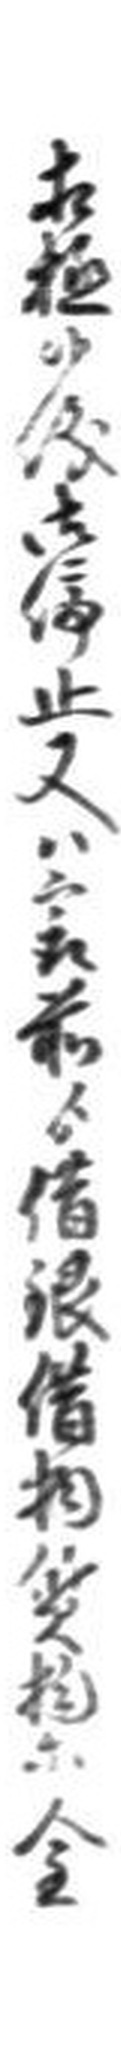相極候儀御停止又ハ最前ゟ借銀借物質物等金
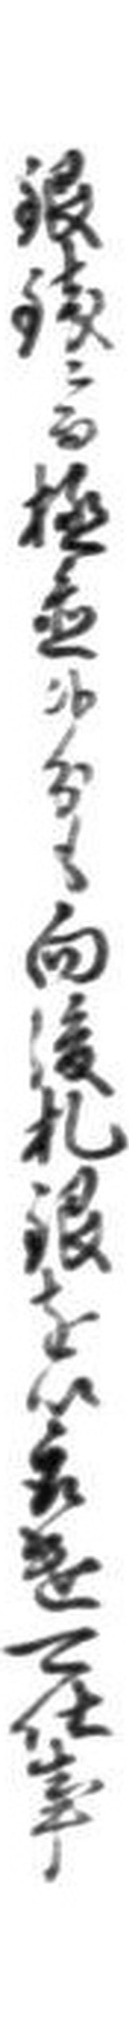銀銭ニ而極置候分も向後札銀を以取遣可仕事
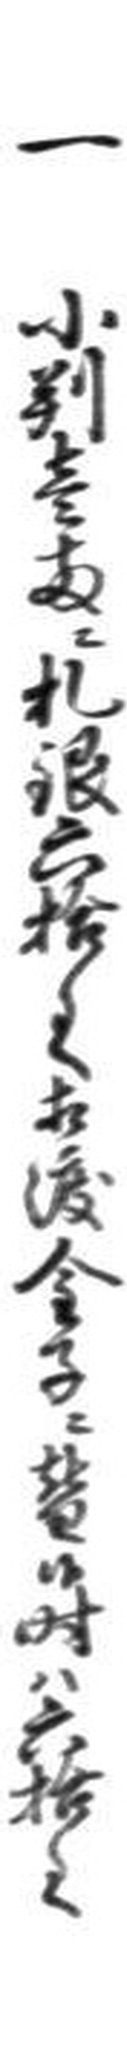一小判壱両ニ札銀六拾匁相渡金子ニ替候時ハ六拾匁

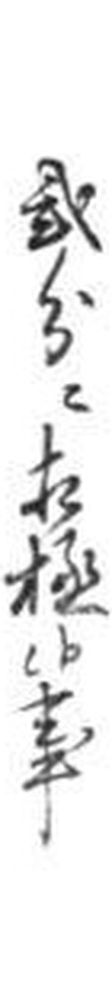弐分ニ相極候事
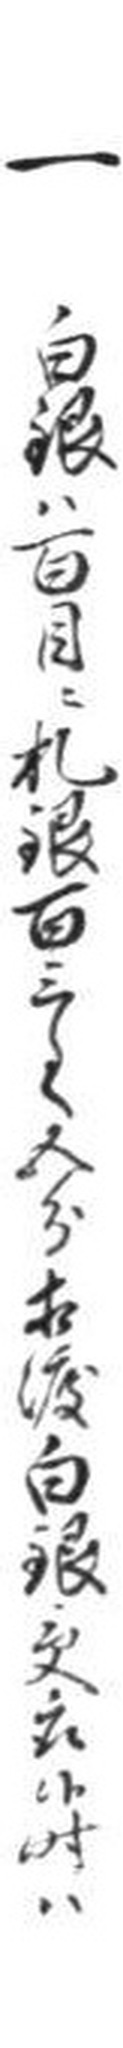一白銀ハ百目ニ札銀百三匁五分相渡白銀受取候時ハ
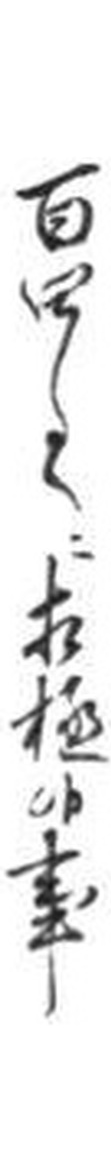百四匁ニ相極候事
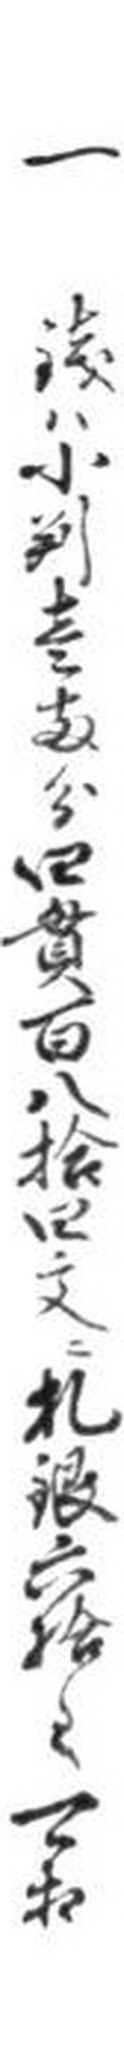一銭ハ小判壱両分四貫百八拾四文ニ札銀六拾匁可相
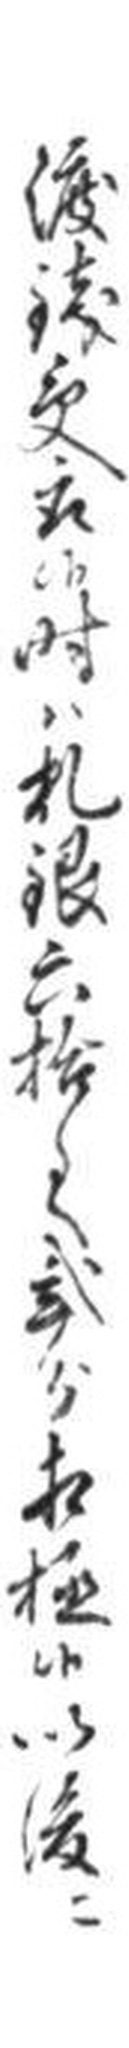渡銭受取候時ハ札銀六拾匁弐分相極候以後ニ
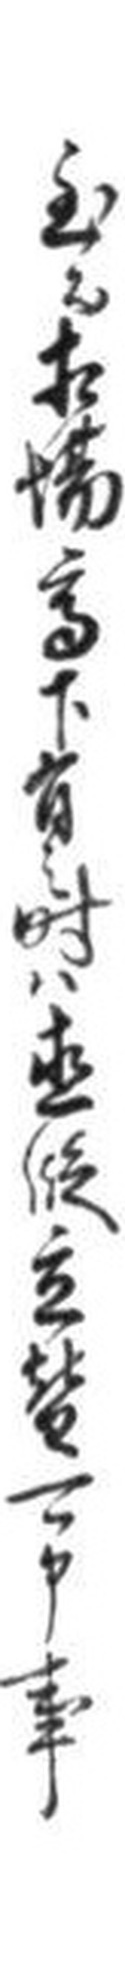至而相場高下有之時ハ直段立替可申事
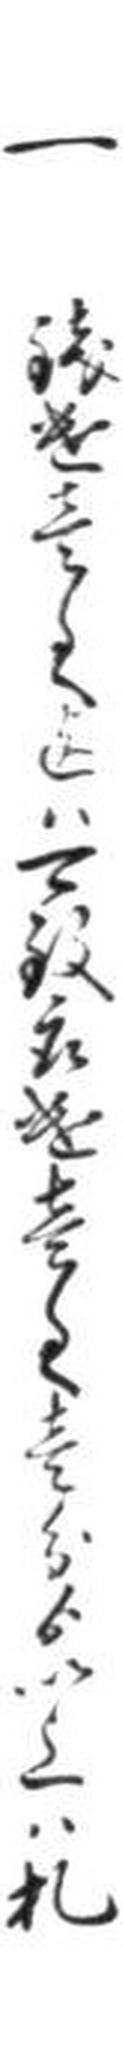一銭遣壱匁迄ハ可致取遣壱匁壱分ゟ以上ハ札
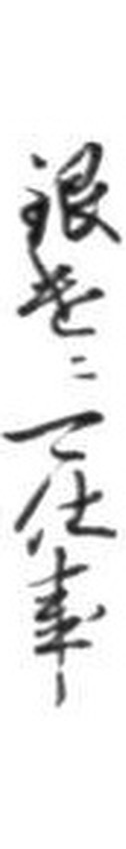銀遣ニ可仕事
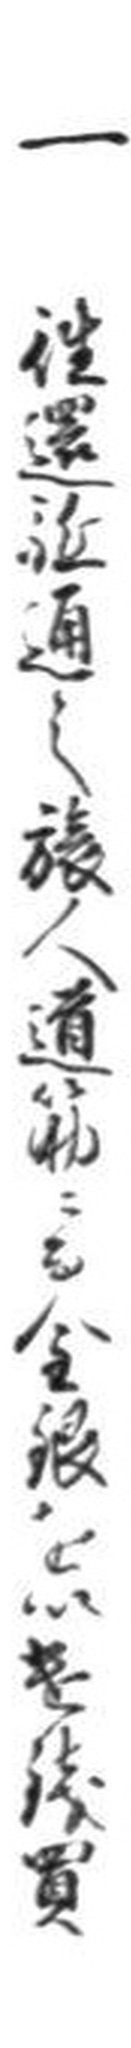一往還駈通之旅人道筋ニ而金銀を以遣銭買
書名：家譜 二十二 吉品公 従元禄十五年到同十六年
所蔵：福井県文書館 Fukui Prefectural Archives
